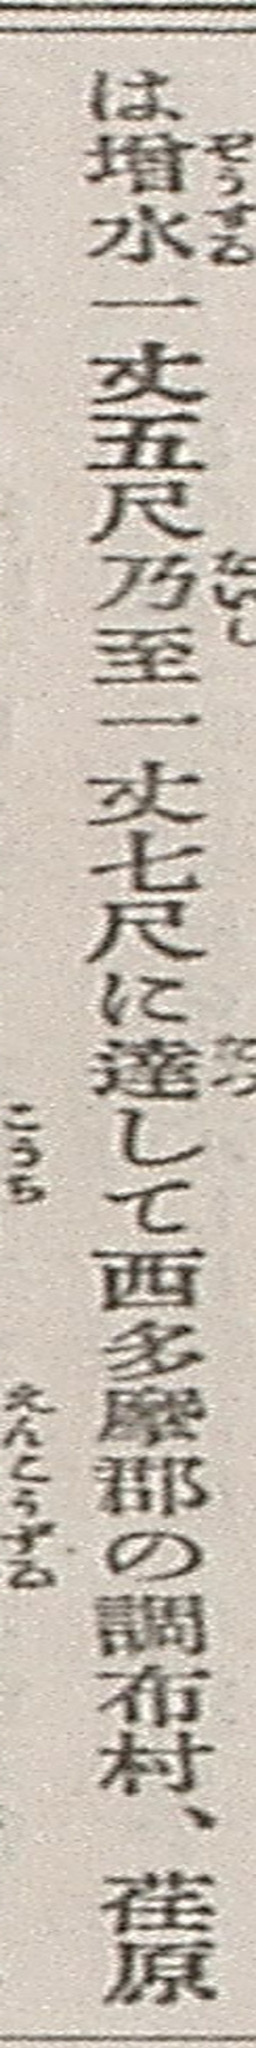は増水一丈五尺乃至一丈七尺に達して西多摩郡の調布村、荏原
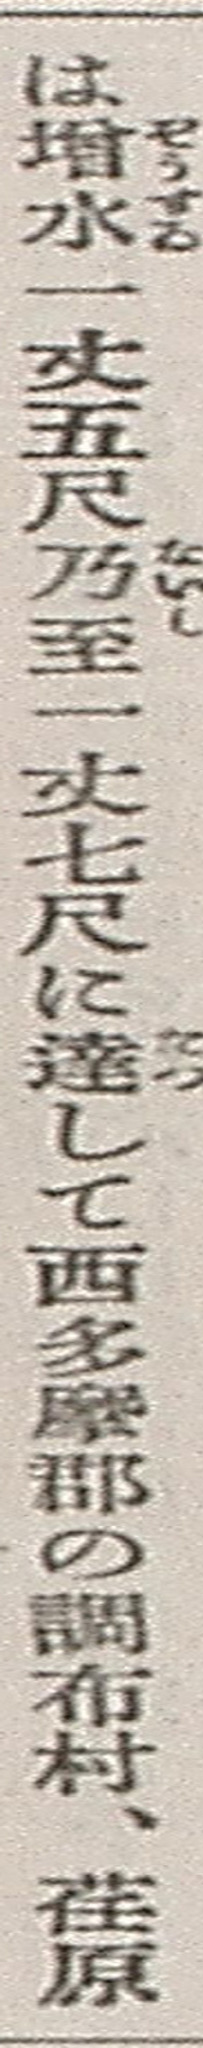は増水一丈五尺乃至一丈七尺に達して西多摩郡の調布村、荏原
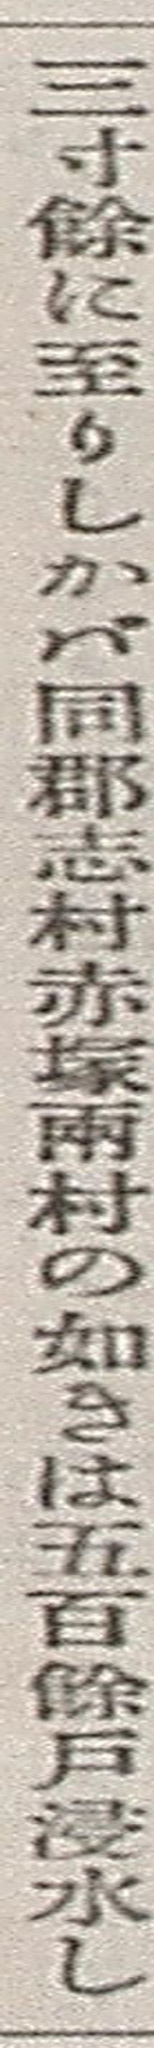三寸余に至りしかバ同郡志村赤塚両村の如きは五百余戸浸水し
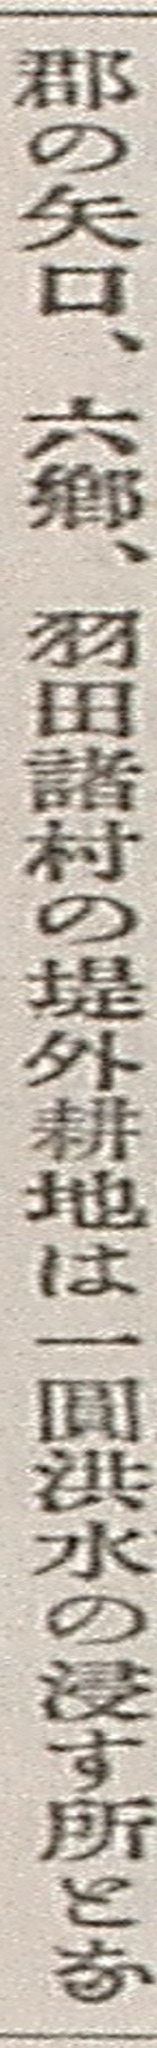郡の矢口、六郷、羽田諸村の堤外耕地は一円洪水の浸す所とな
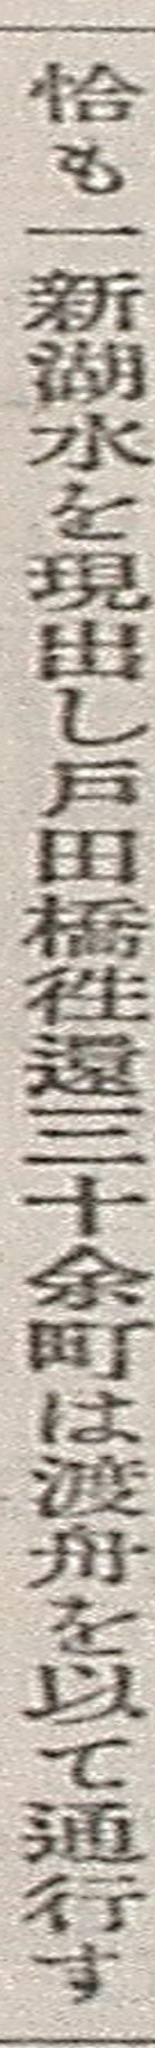恰も一新湖水を現出し戸田橋往還三十余町は渡舟を以て通行す
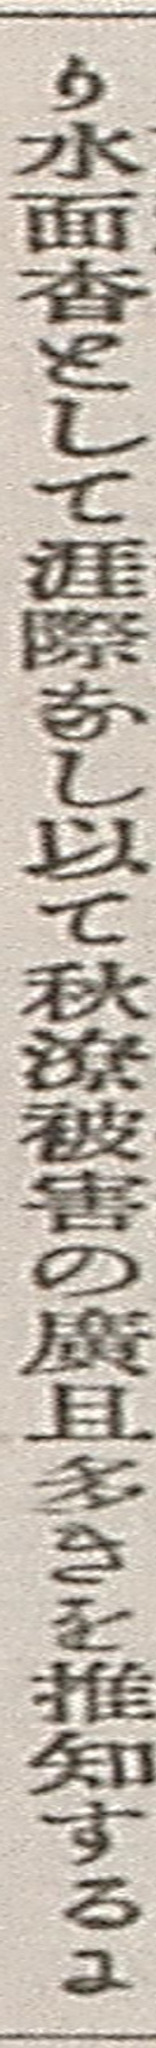り水面杳として涯際なし以て秋潦被害の広且多きを推知するに
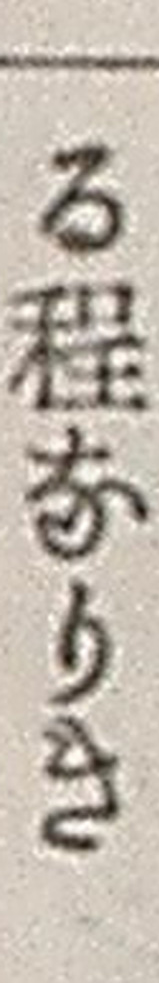る程なりき
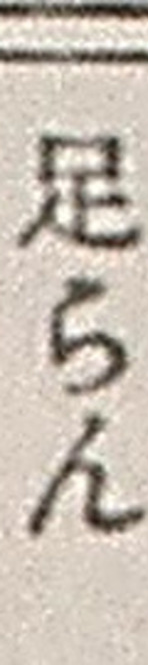足らん
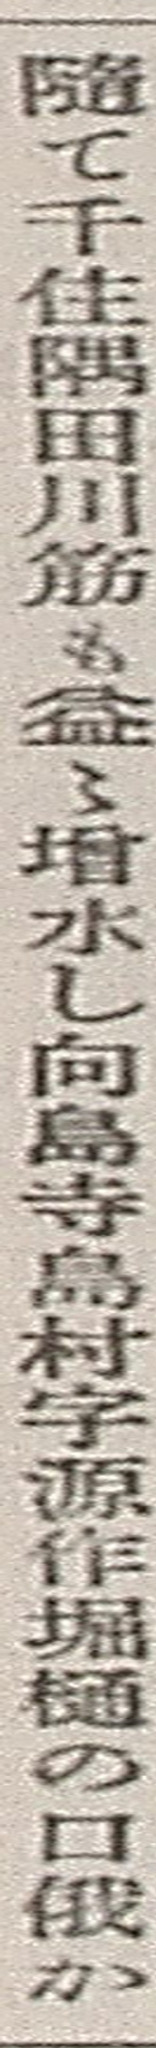随て千住隅田川筋も益々増水し向島寺島村字源作堀樋の口俄か
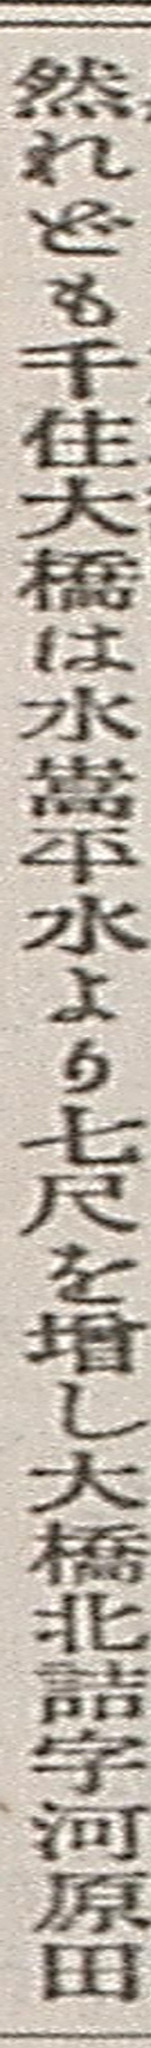然れども千住大橋は水嵩平水より七尺を増し大橋北詰字河原田
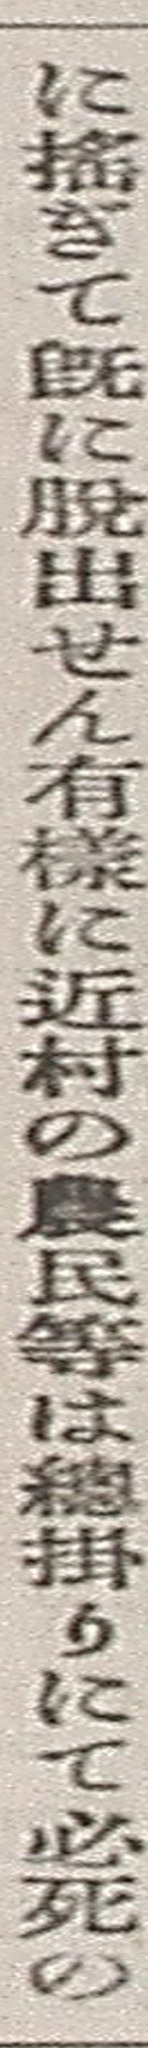に揺ぎて既に脱出せん有様に近村の農民等は総掛りにて必死の
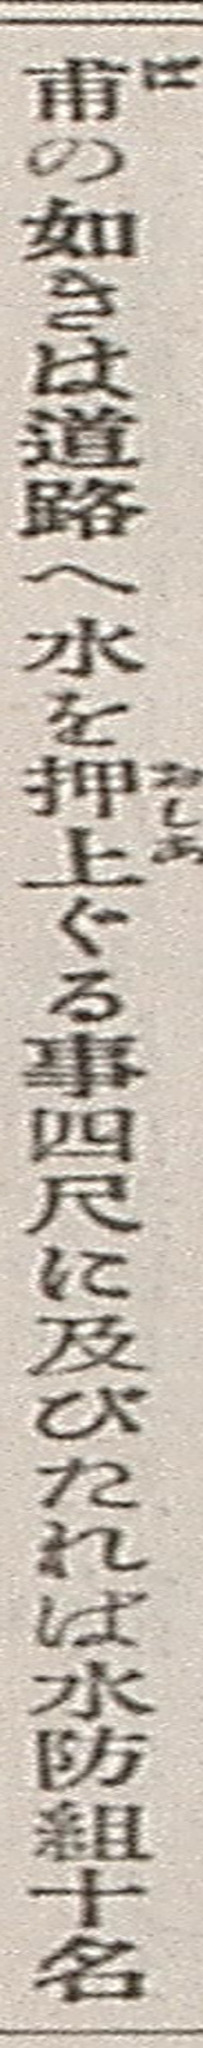甫の如きは道路へ水を押上ぐる事四尺に及びたれば水防組十名
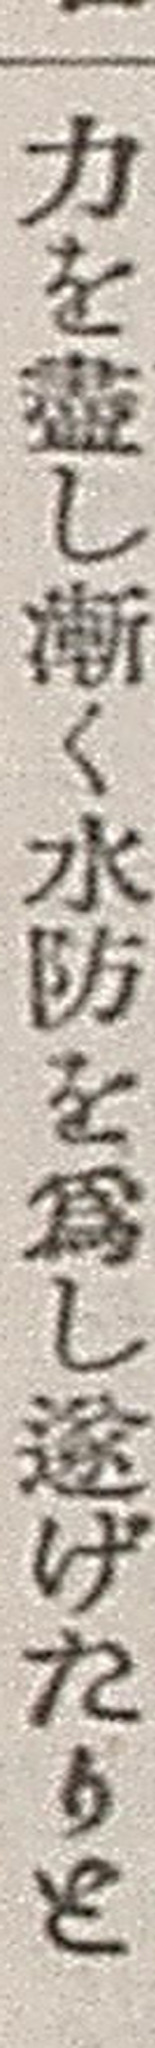力を尽し漸く水防を為し遂げたりと
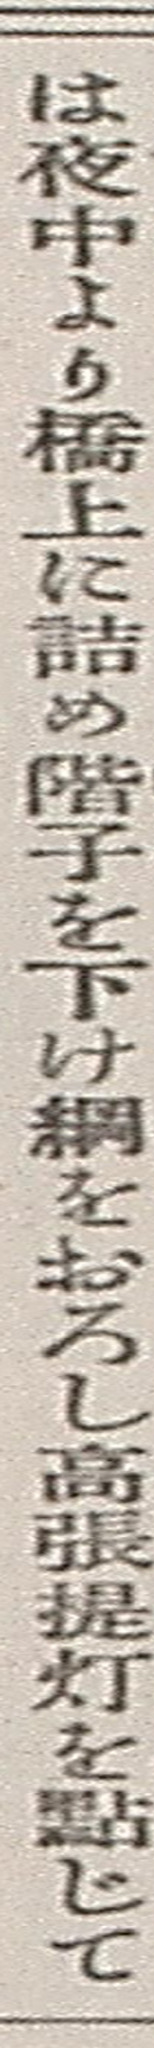は夜中より橋上に詰め階子を下け綱をおろし高張提灯を点じて
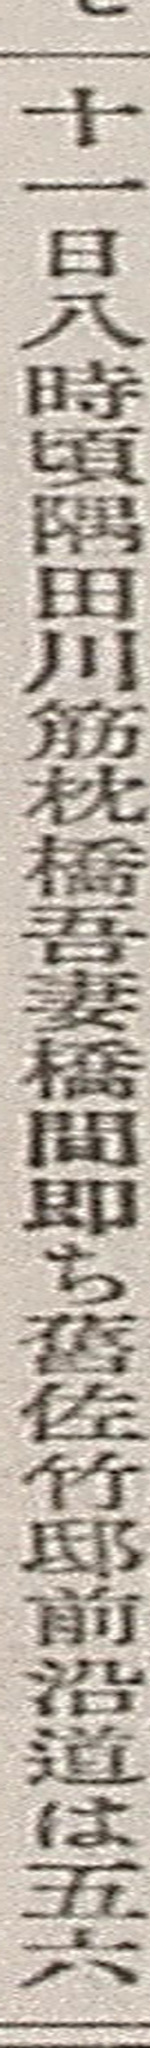十一日八時頃隅田川筋枕橋吾妻橋間即ち旧佐竹邸前沿道は五六
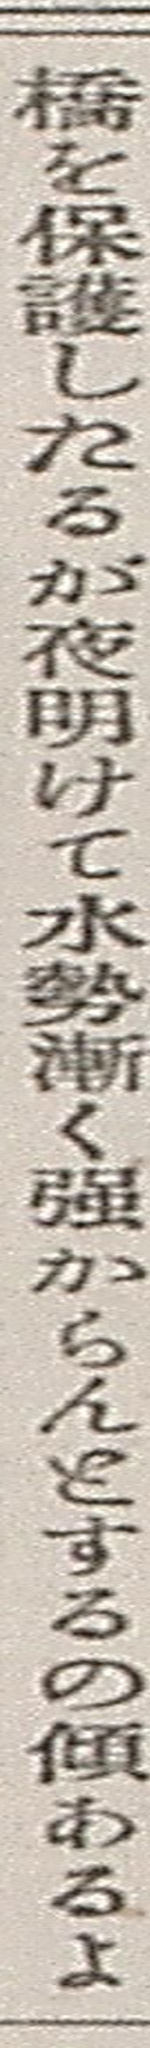橋を保護したるが夜明けて水勢漸く強からんとするの傾あるよ
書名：風俗畫報臨時増刊第百二十四號　洪水地震被害録（上）
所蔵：東京大学地震研究所図書室 Earthquake Research Institute Library, The University of Tokyo, JAPAN
